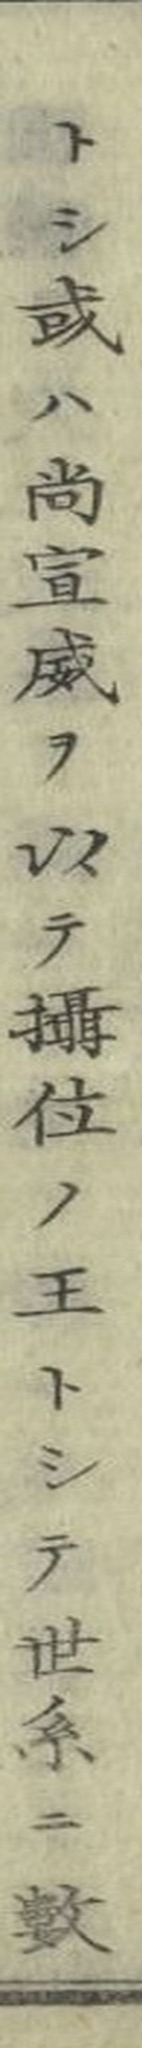トシ或ハ尚宣威ヲ以テ攝位ノ王トシテ世系ニ數
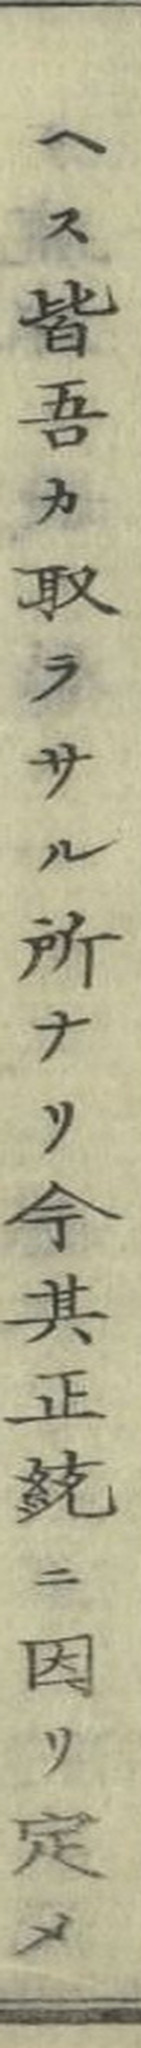ヘス皆吾カ取ラサル所ナリ今其正統ニ因リ定メ
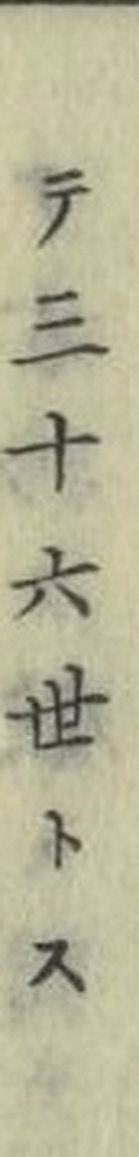テ三十六世トス
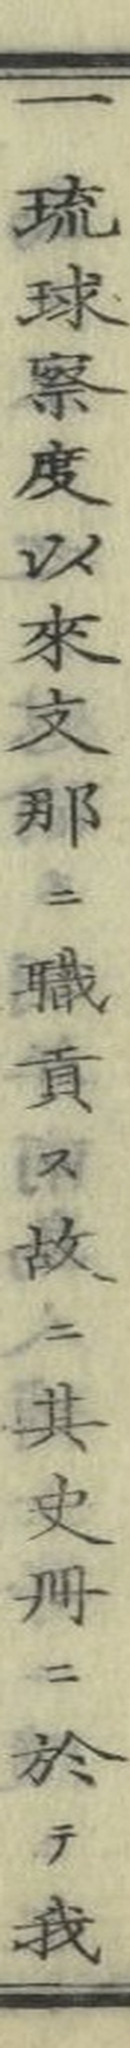一琉球察度以來支那ニ職貢ス故ニ其史冊ニ於テ我
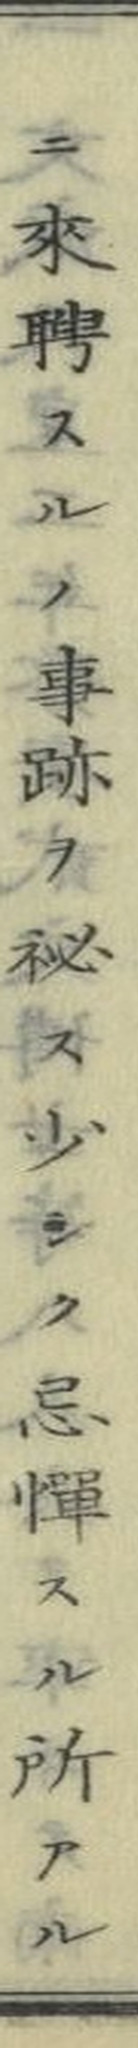ニ來聘スルノ事跡ヲ秘ス少シク忌惮スル所アル
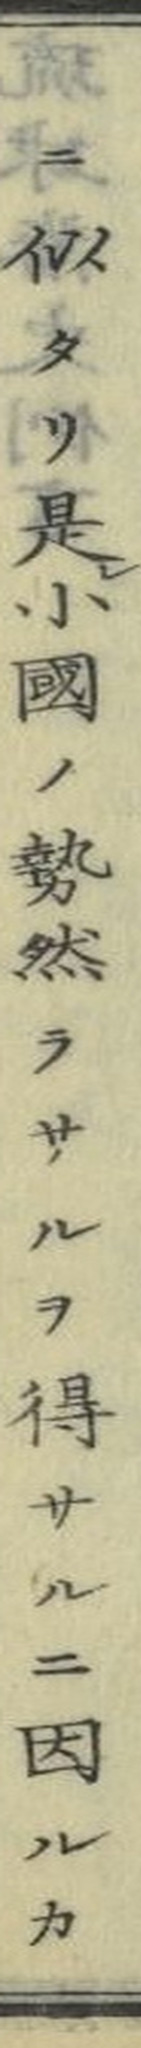ニ似タリ是レ小國ノ勢然ラサルヲ得サルニ因ルカ
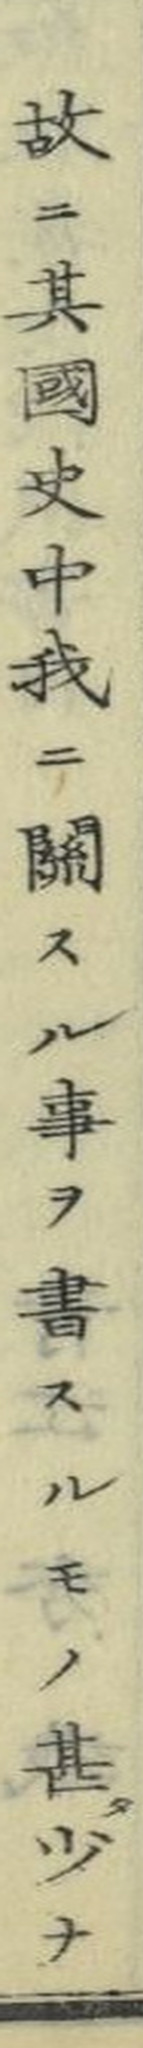故ニ其國史中我ニ關スル事ヲ書スルモノ甚タ少ナ
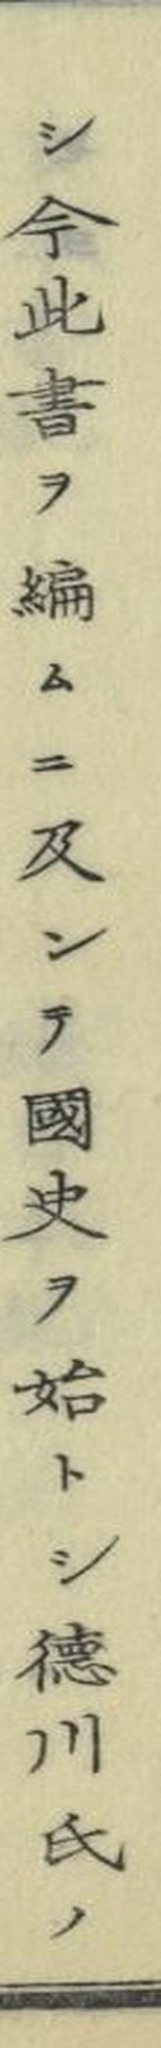シ今此書ヲ編ムニ及ンテ國史ヲ始トシ德川氏ノ
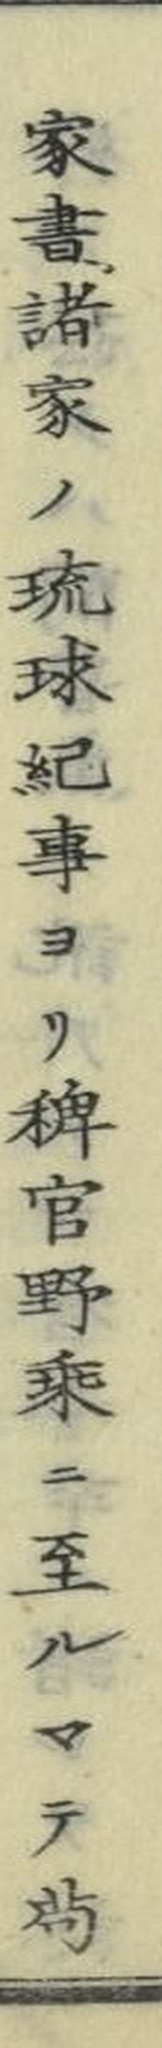家書諸家ノ琉球紀事ヨリ稗官野乘ニ至ルマテ苟
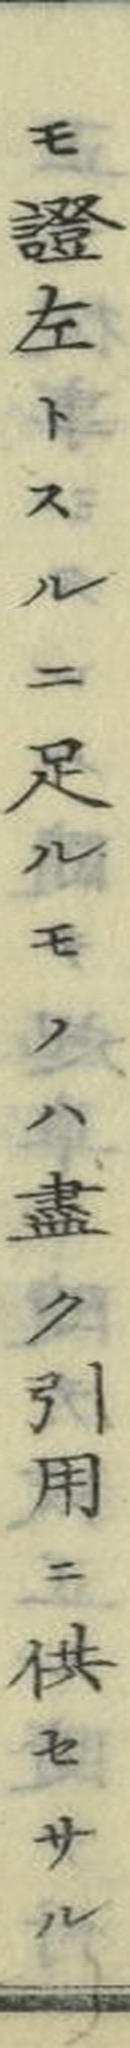モ證左トスルニ足ルモノハ盡ク引用ニ供セサル
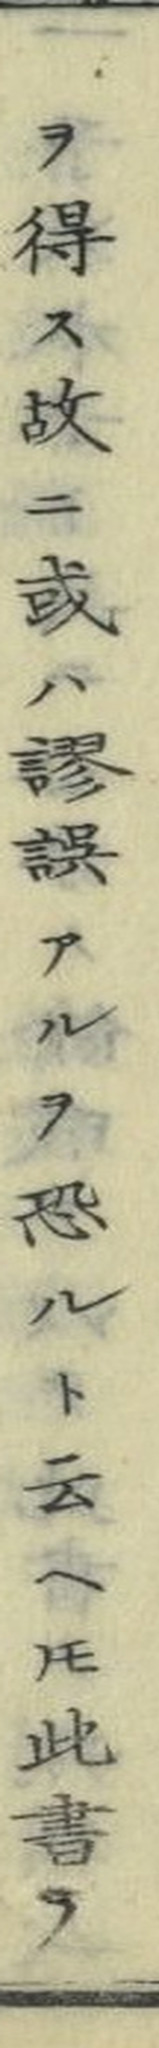ヲ得ス故ニ或ハ謬誤アルヲ恐ルト云ヘトモ此書ヲ
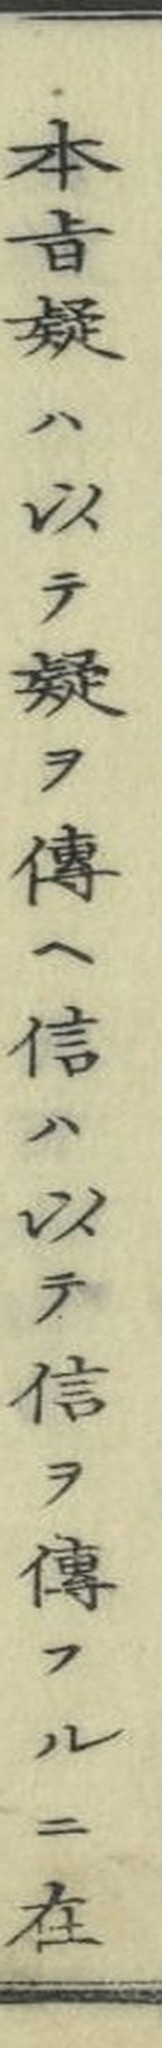本㫖疑ハ以テ疑ヲ傳ヘ信ハ以テ信ヲ傳フルニ在
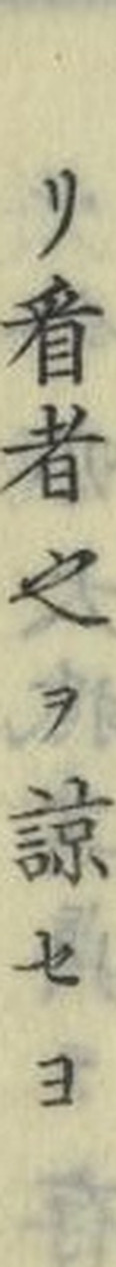リ者之ヲ諒セヨ
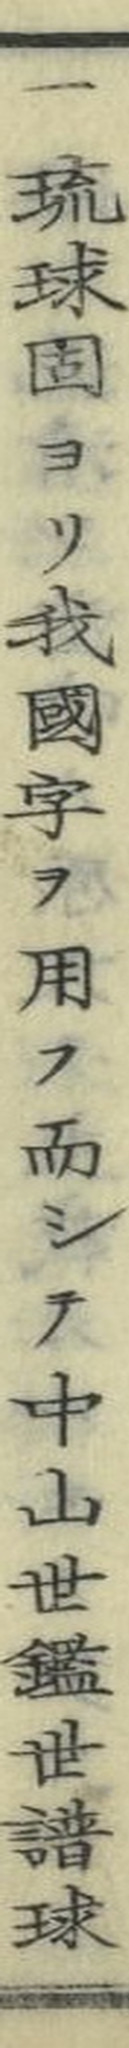一琉球固ヨリ我國字ヲ用フ而シテ中山世鑑世譜球
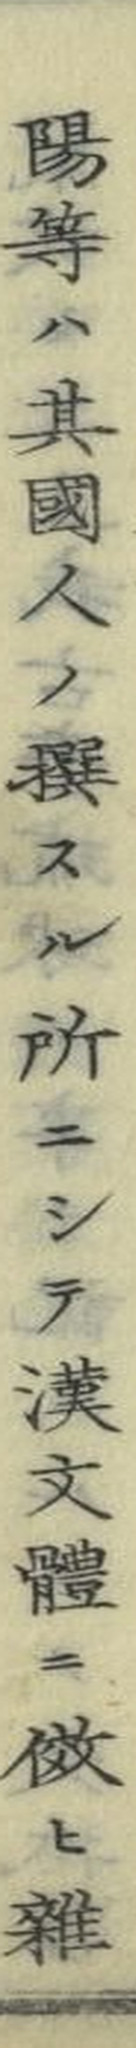陽等ハ其國人ノ撰スル所ニシテ漢文體ニ傚ヒ雜
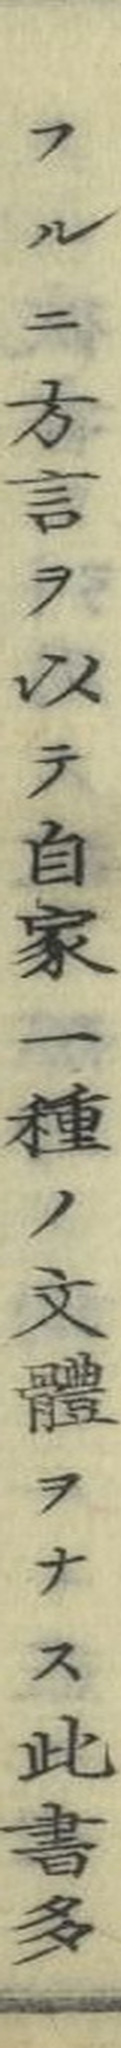フルニ方言ヲ以テ自家一種ノ文體ヲナス此書多
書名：琉球藩史 一之巻
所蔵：University of the Ryukyus Library
